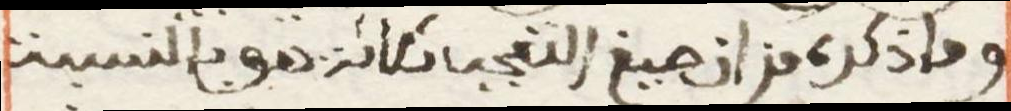وما ذكره من ان صيغ التعجب ثلاثة هو بالنسبة
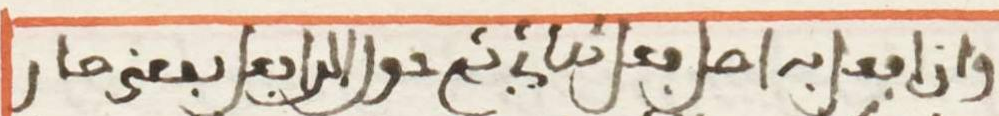وان افعل به اصل فعل ثلاثي ثم حول الى فعل بمعنى صار
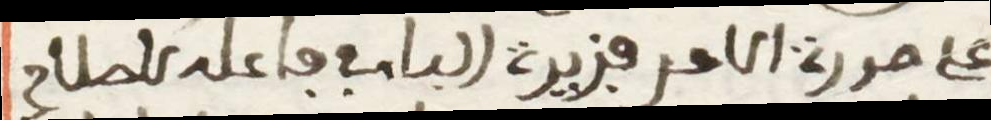على صورة الامر فزيدة الباء في فاعله للصلاح
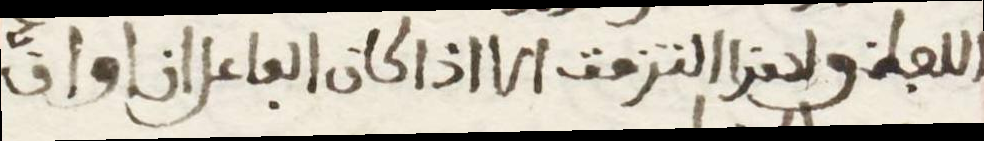اللفاء ولهذا التزمت الا اذا كان الفاعل انا واق
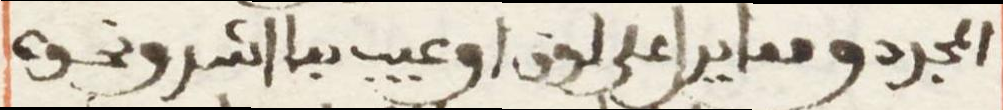المجرد ومما يدل على لون او عيب بما اشد ونحوه
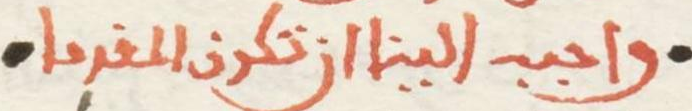واحبب الينا ان تكون المقدما
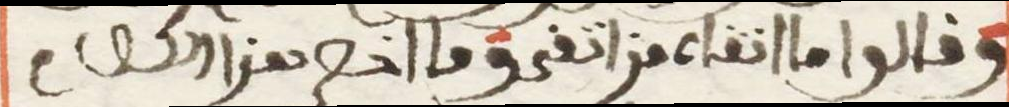وقالوا ما اتقاه من اتقى وما اخص هذا الكلام
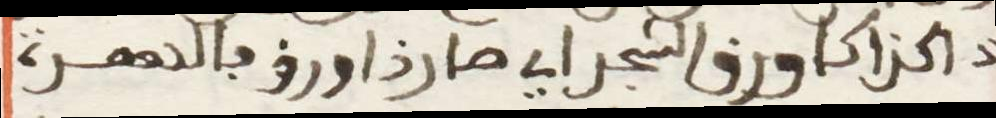ذا كذا كاورق الشجر اي صار ذا ورق فالهمزة
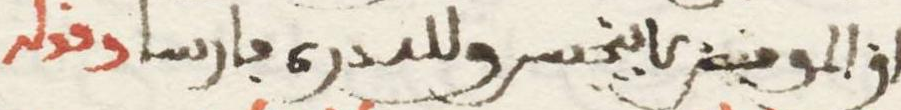ان المومين لا ينجس ولله دره فارسا وقوله
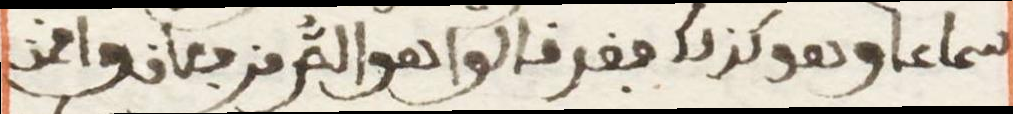سماعا وهو كذلك فقد قالوا هو الص من بلاقع اقمن
